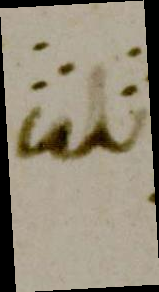ثلث
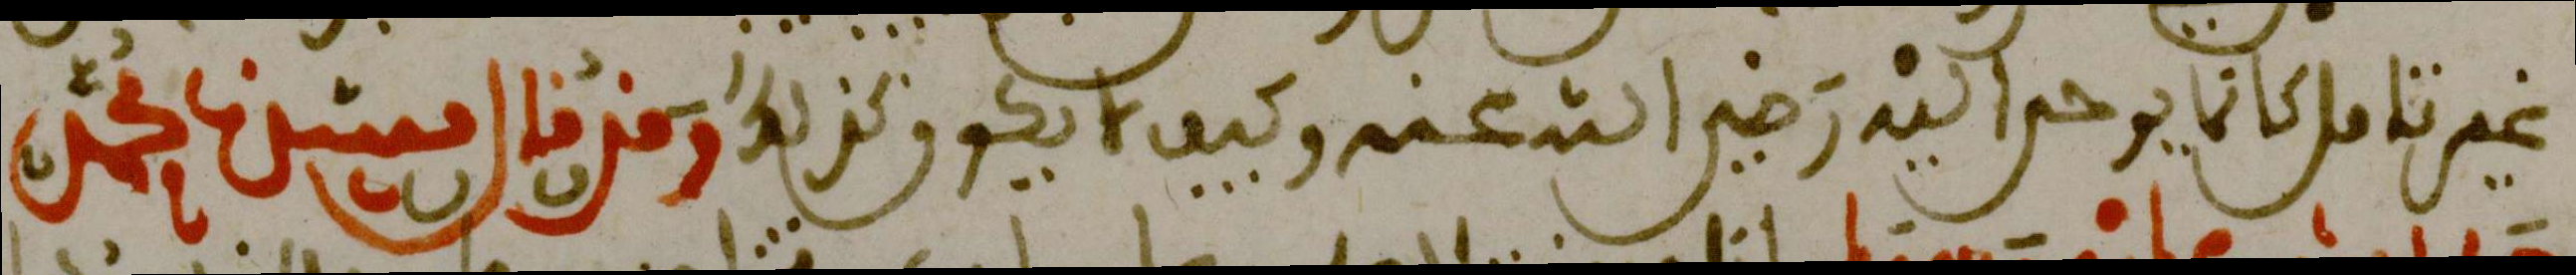غير تامل كانما يوحى اليه رضي الله عنه كيف لا يكون كذلك ومن قال سيدنا محمد
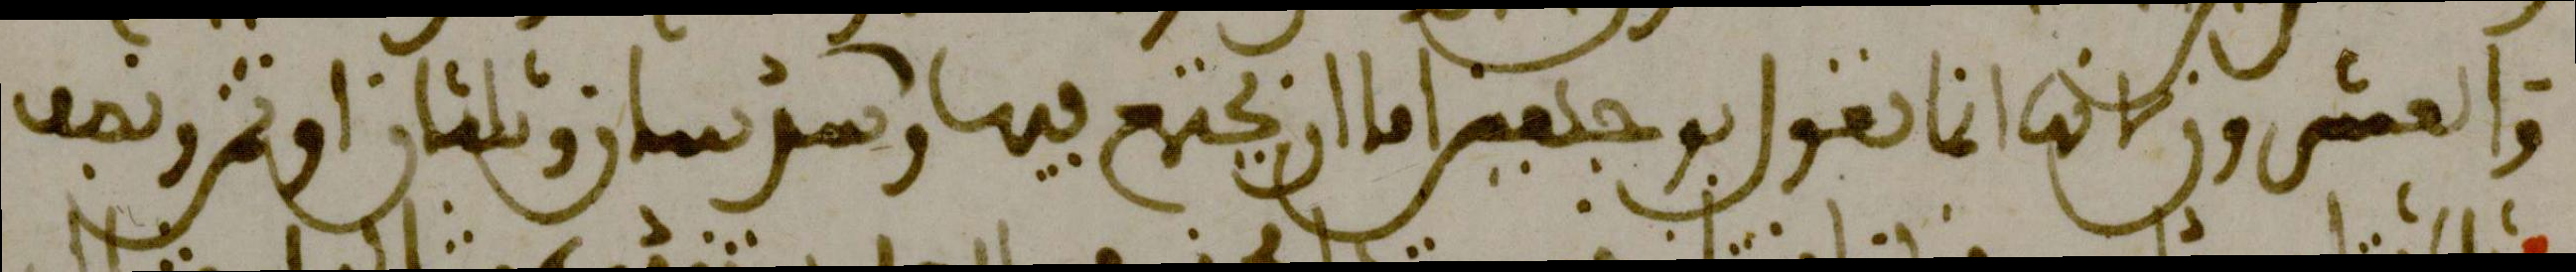والعشرون لانها انما تعول بوجهين اما ان يجتمع فيها وسدسان وثلثان او ثمن ونصف
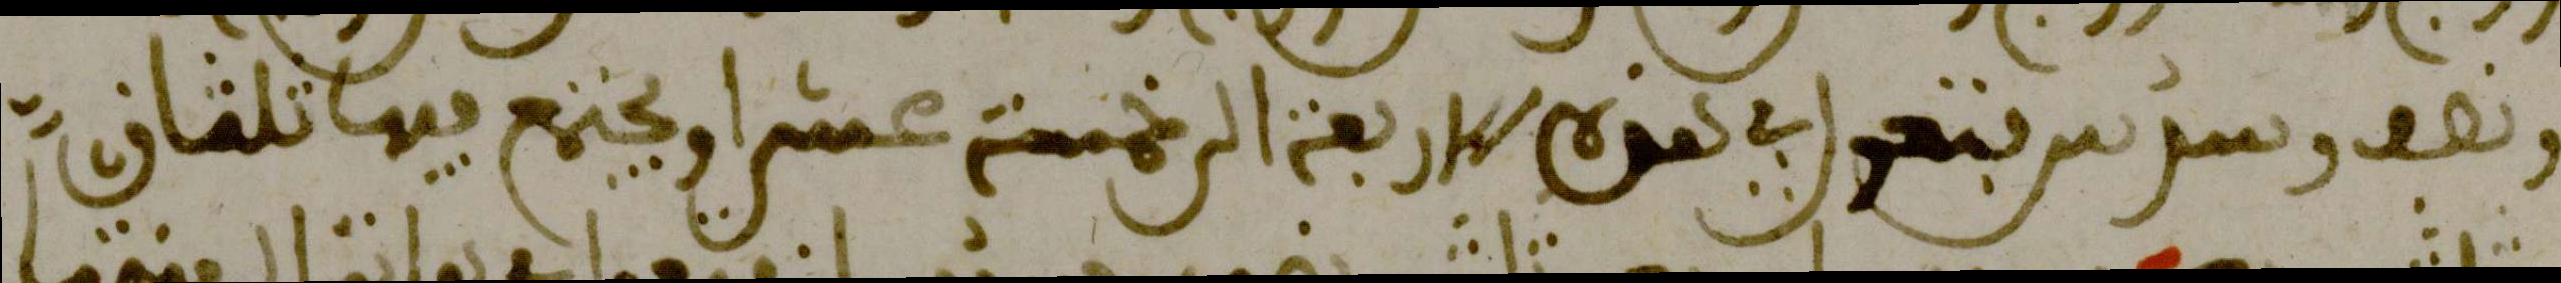ونصف وسدس فتعول في هذه الاربعة الى خمسة عشر او يجتمع فيها ثلثان
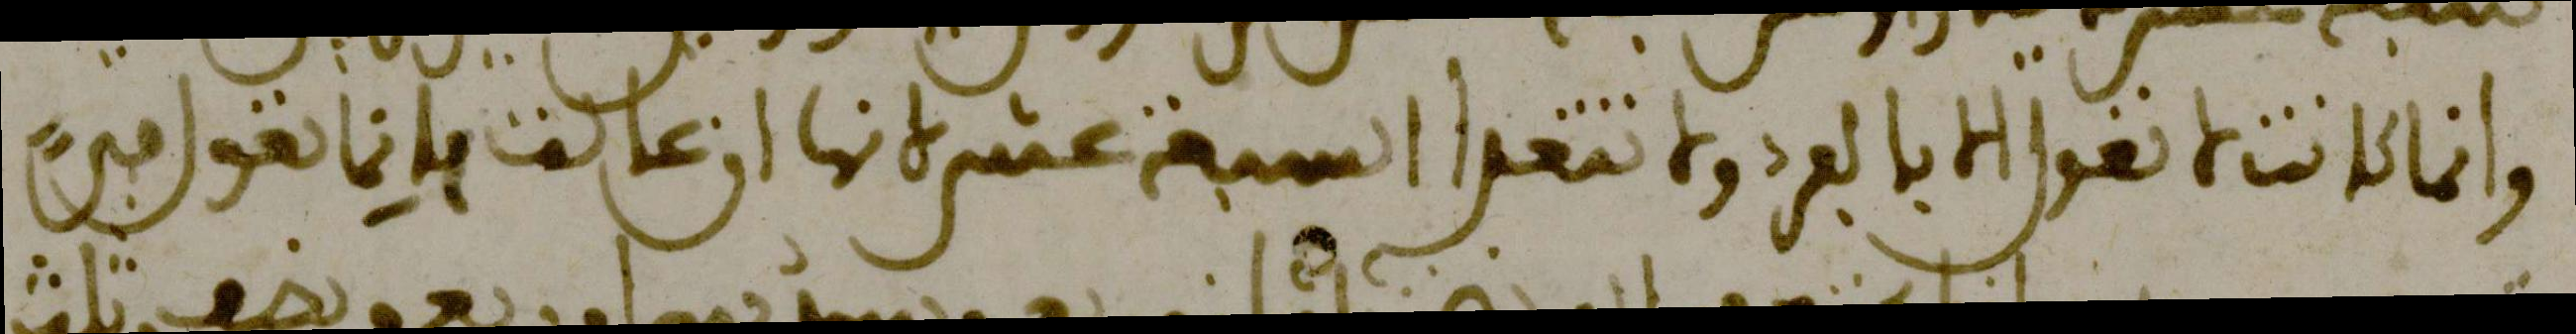وانما كانت لا تعول الا بالفرد ولا تتعدا السبعة عشر لانها ان عالت فانما تعول في
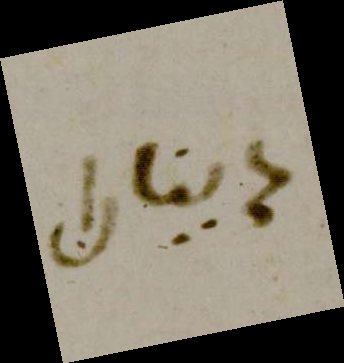دينارا
